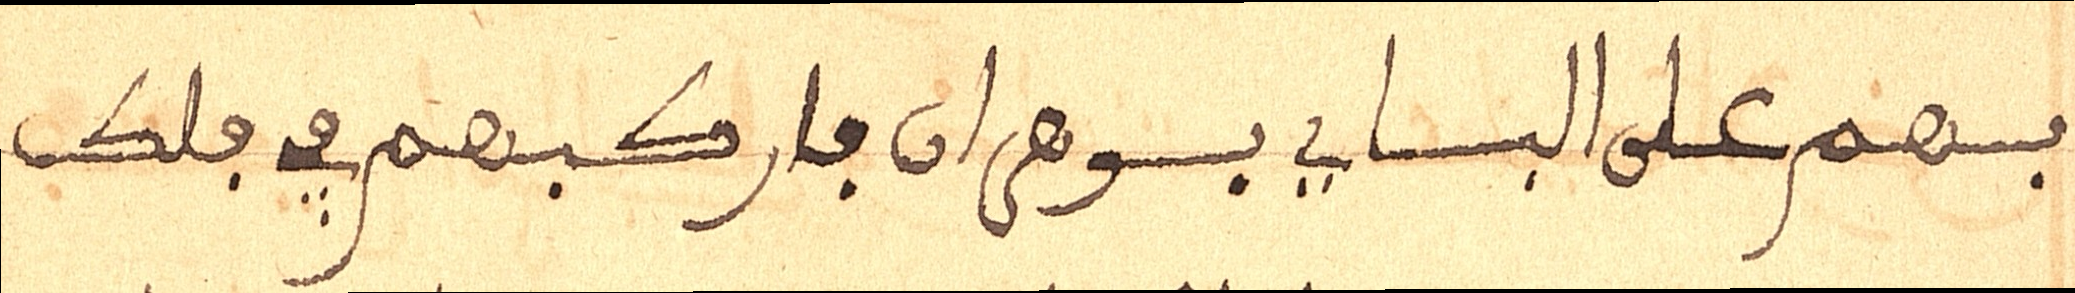بهم على الباي بوهران فاركبهم في فلك
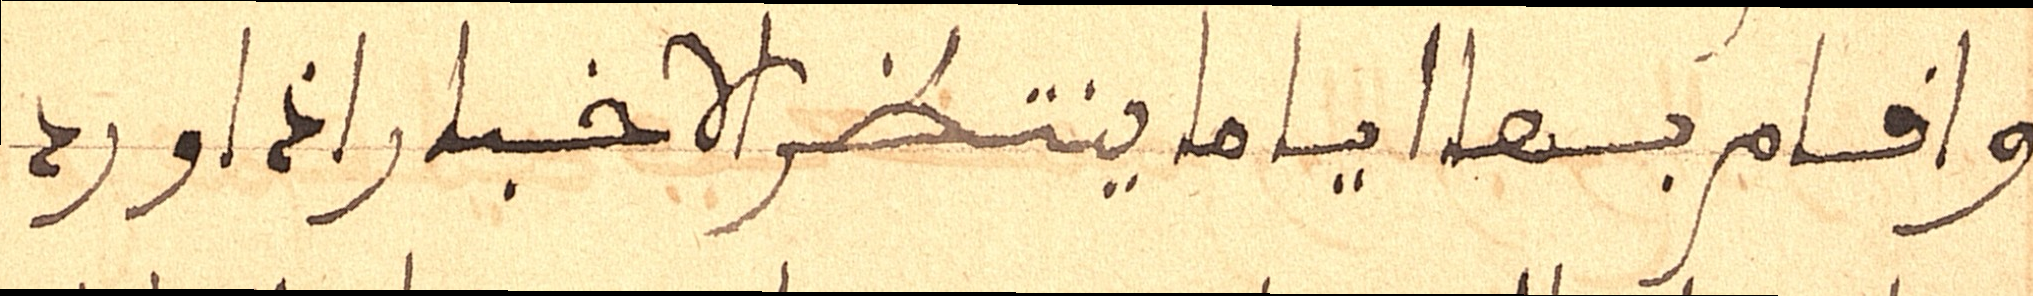واقام بها اياما ينتظر الاخبار اذا ورد
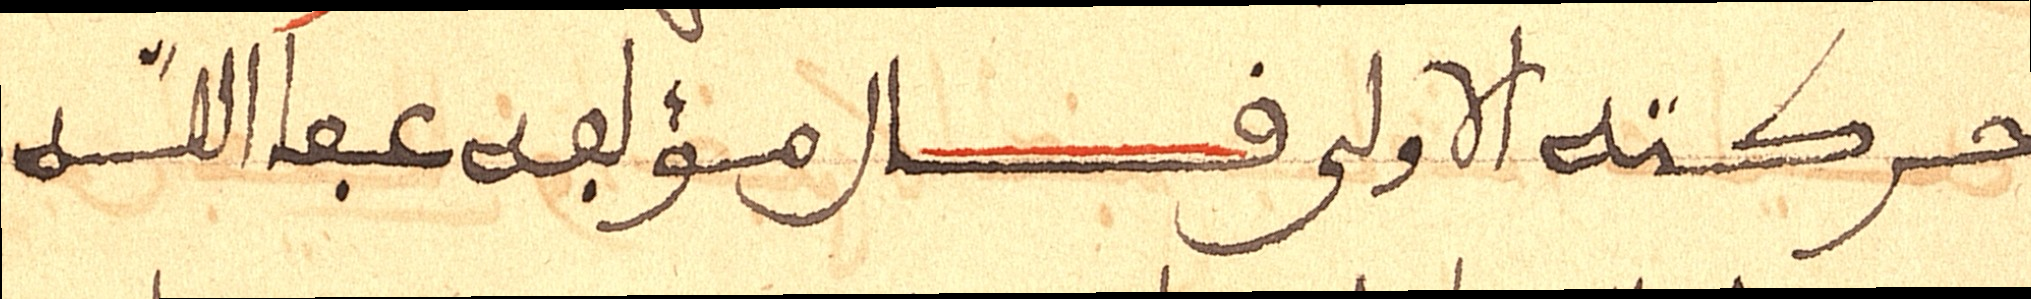حركته الاولى قال مؤلفه عفا الله
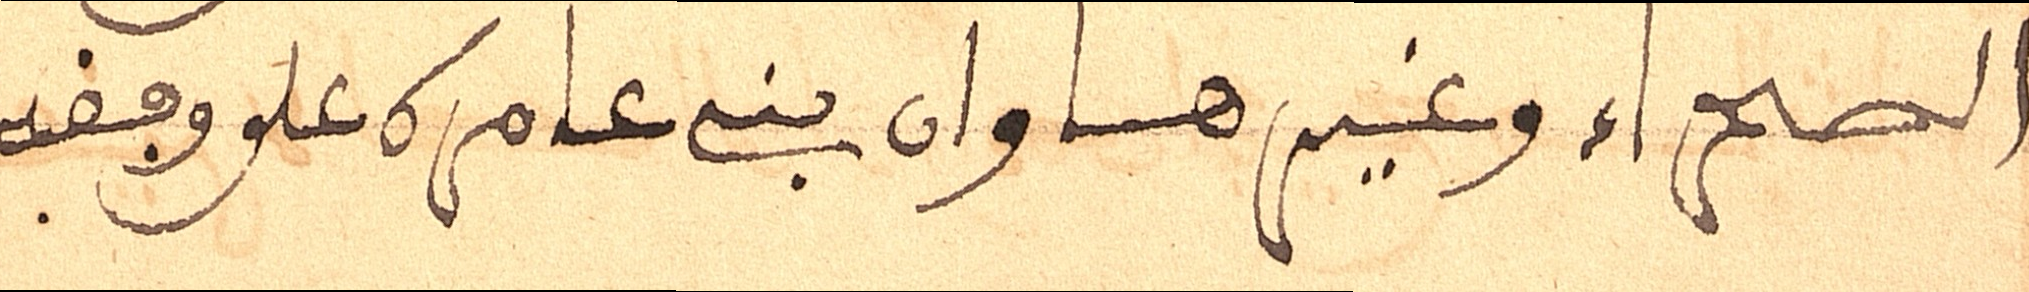الصحراء وغيرها وان بنى عامره على وفقه
